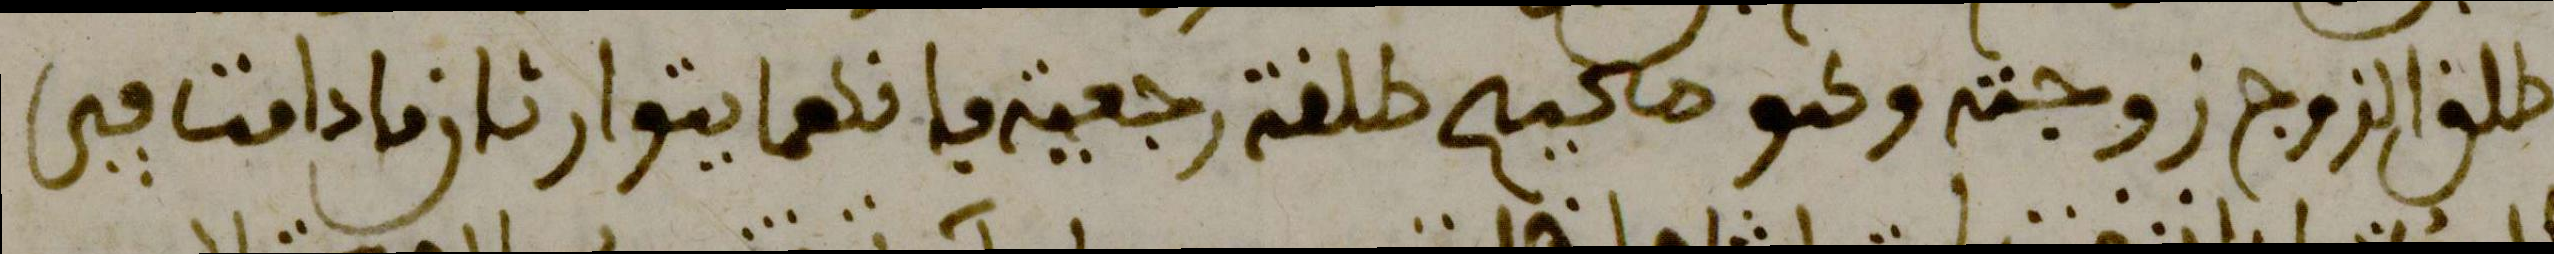طلق الزوج زوجته و هو صحيح طلقة رجعية فانهما يتوارثان ما دامت في
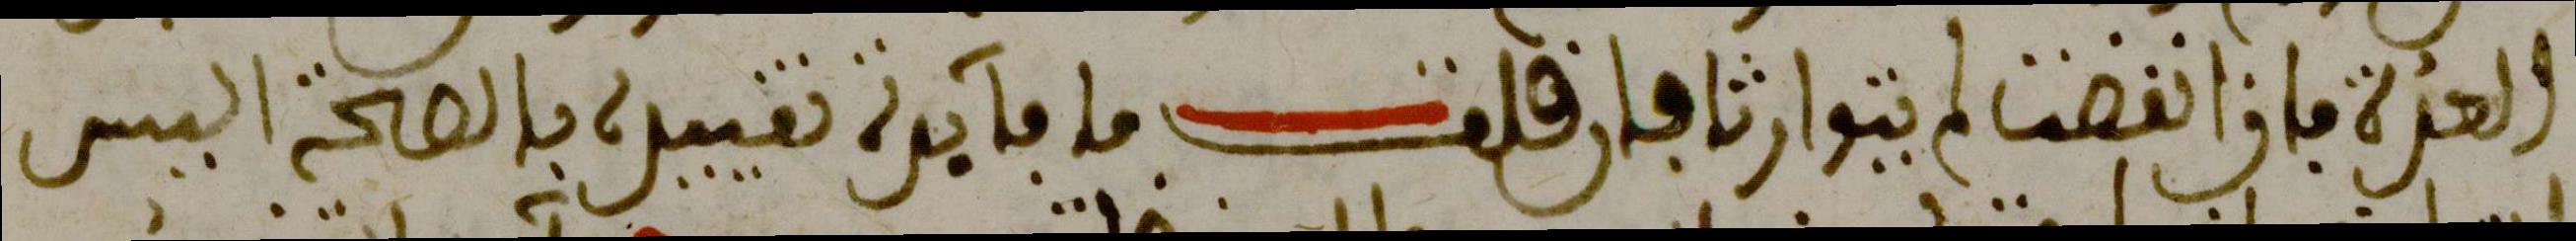العدة فان انقضت لم يتوارثا فان قلت ما فائدة تقييده بالصحة اليس
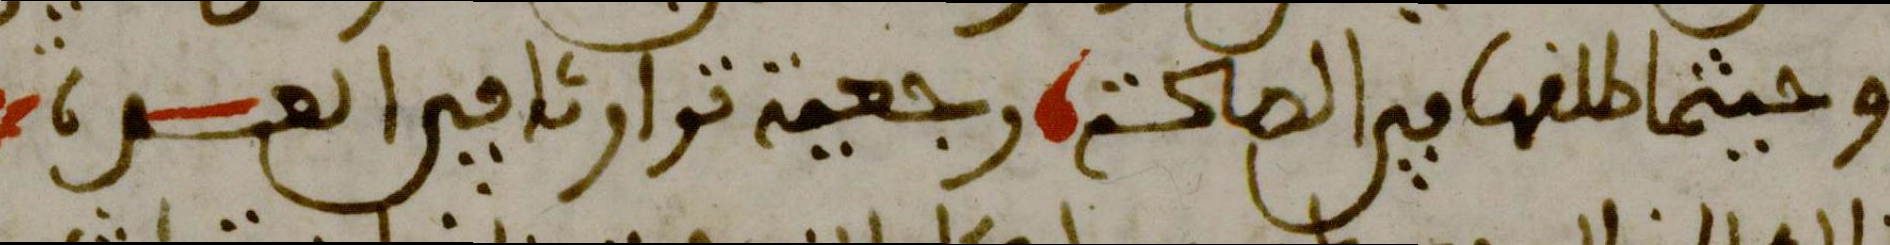و حيثما طلقها في الصحة رجعية توارثا في العدة
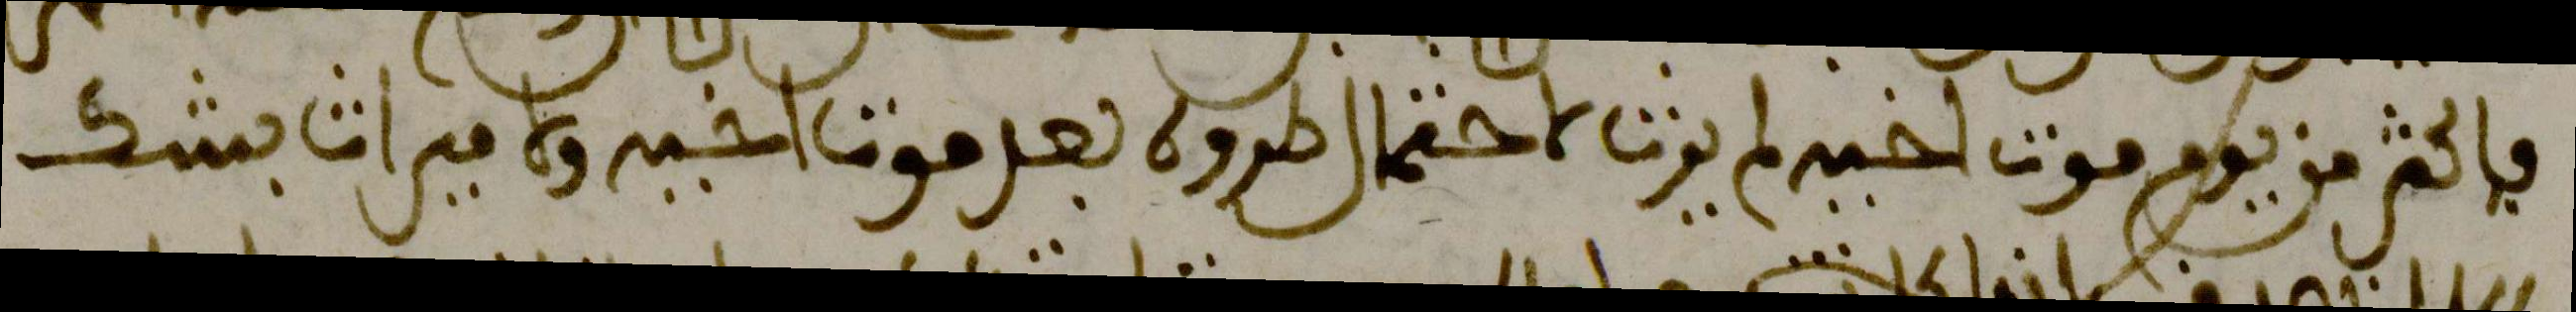فاكثر من يوم موت اخيه لم يرث لاحتمال طروه بعد موت اخيه و لا ميراث بشك
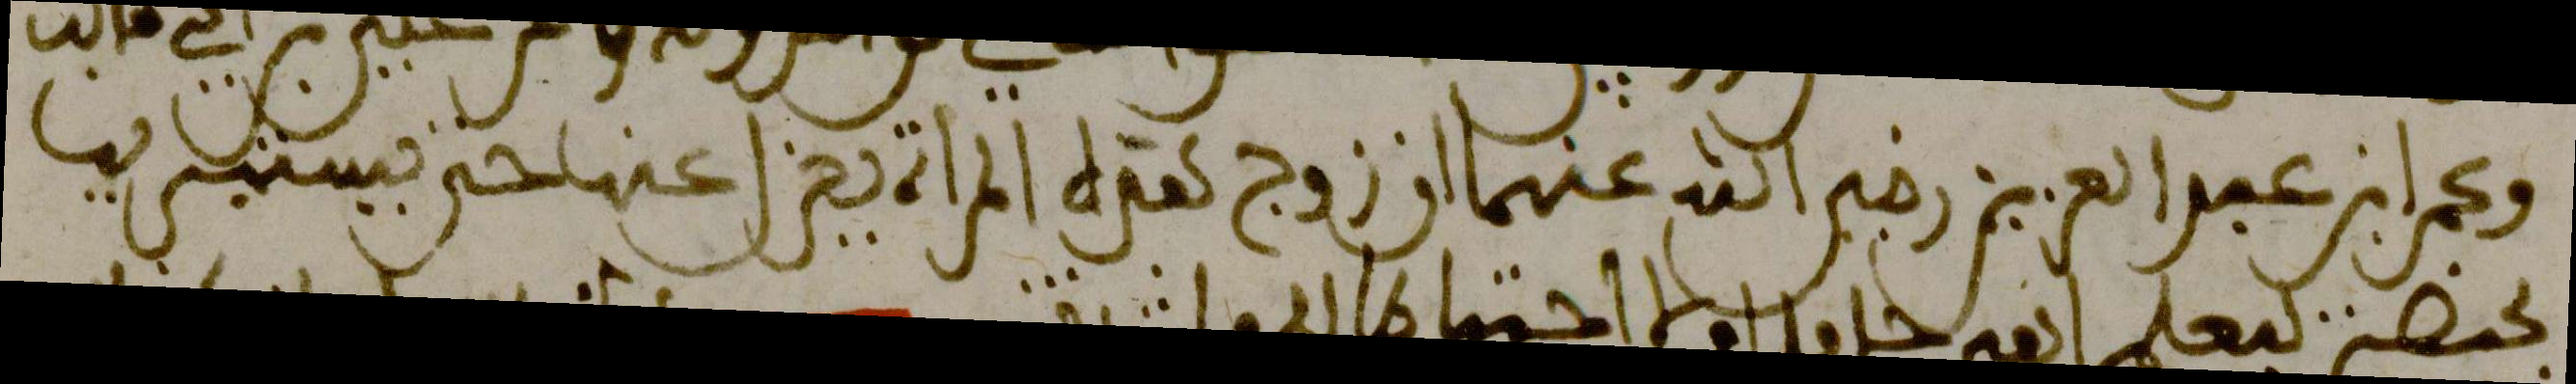و عمر ابن عبد العزيز رضي الله عنهما ان زوج هذه المراة يعزل عنها حتى يستبريها
